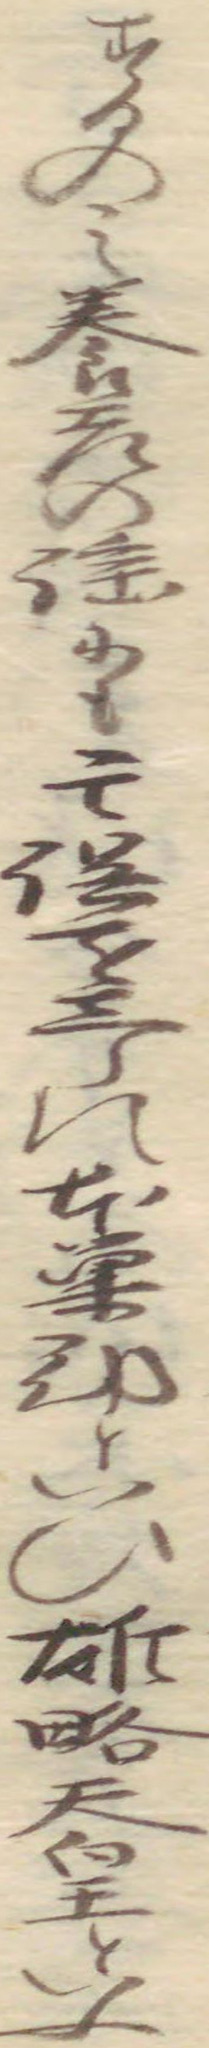するのみ養老の謡にも其誤をしらす本巣郡といひ雄略天皇といふ
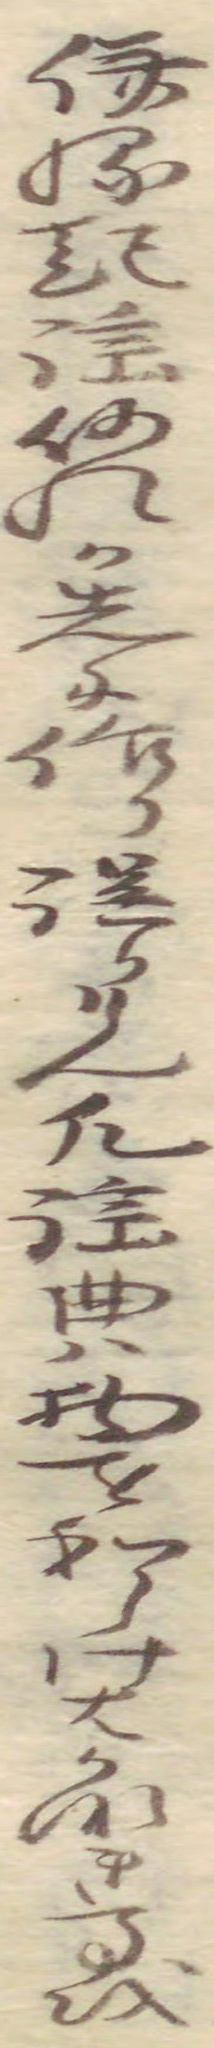併縁起謡何れか先に作り誤りけん凡謡曲は物を和らけはかなき事を
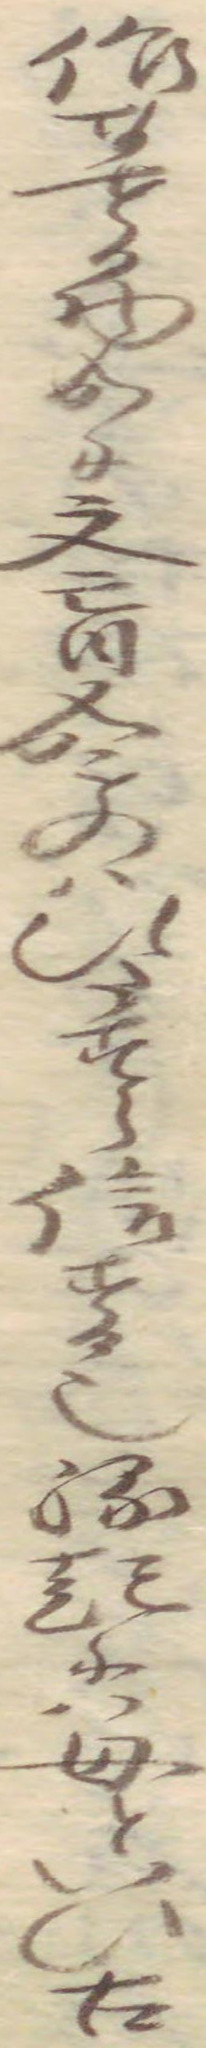作なせる物成に文盲成ものはひたすら信する也縁起には母といひ古
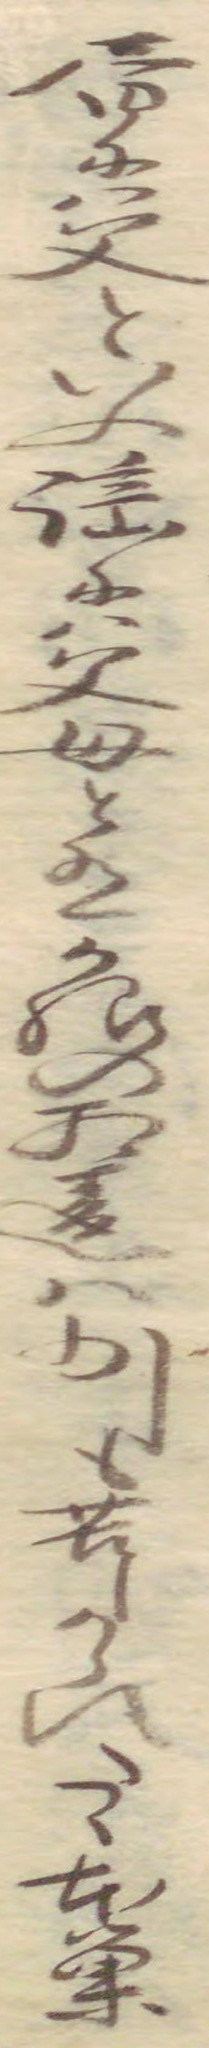書には父といふ謡には父母と有か様の相違は少しも苦しからすたゝ本巣
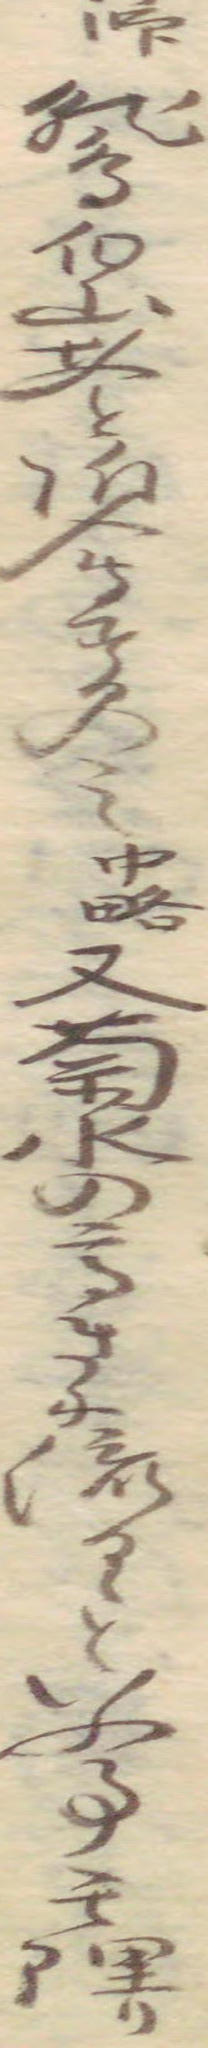鷲白山なと附会するのみ中略又菊水の高きに流るゝといふ事其理り
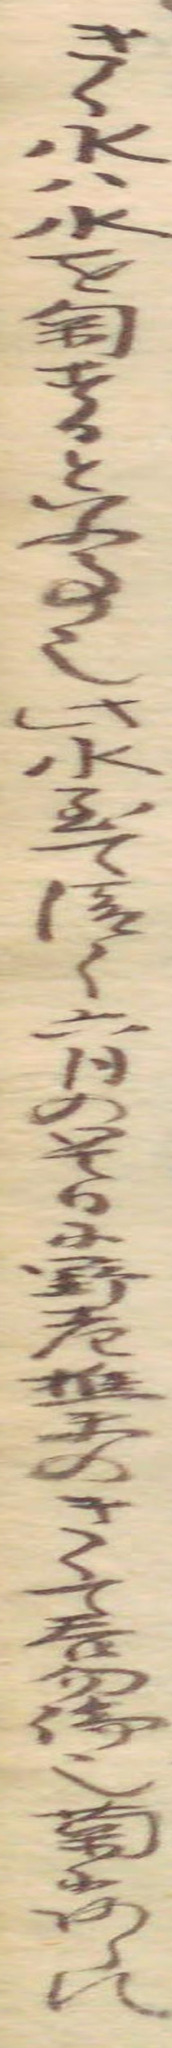いはくきく水は水を匊するといふ事也此水至て清く六月の暑日に野老樵夫のきくて呑勿論也菊にあらす

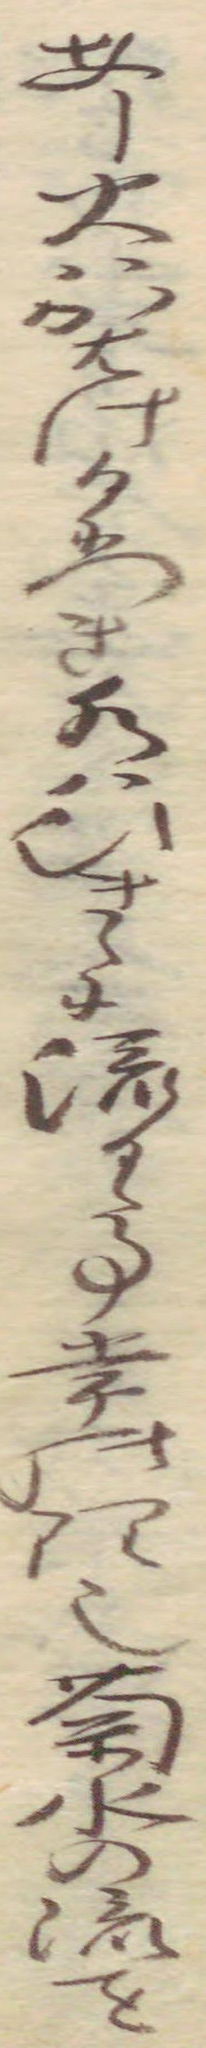なし火はかはけるにつき水はひきゝに流るゝ事常の理也菊水の流を
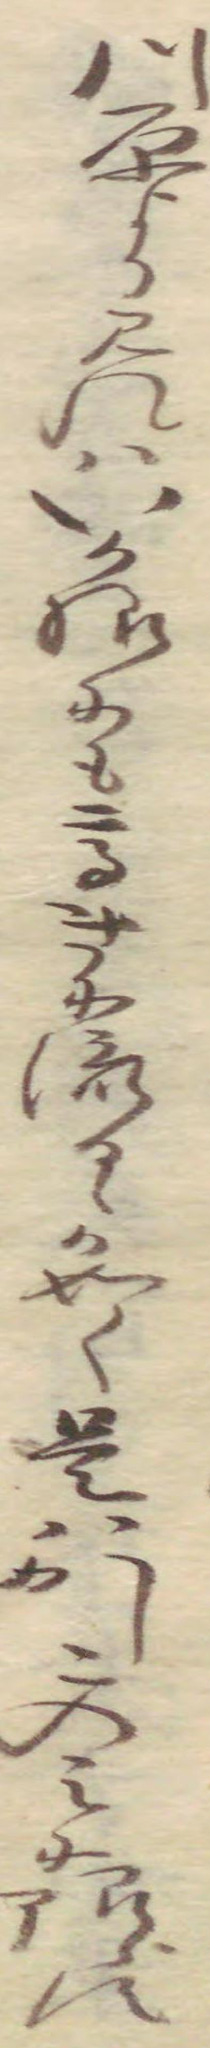川原より見れはいか様にも高きに流るゝか如く是はかしこのみに限らす
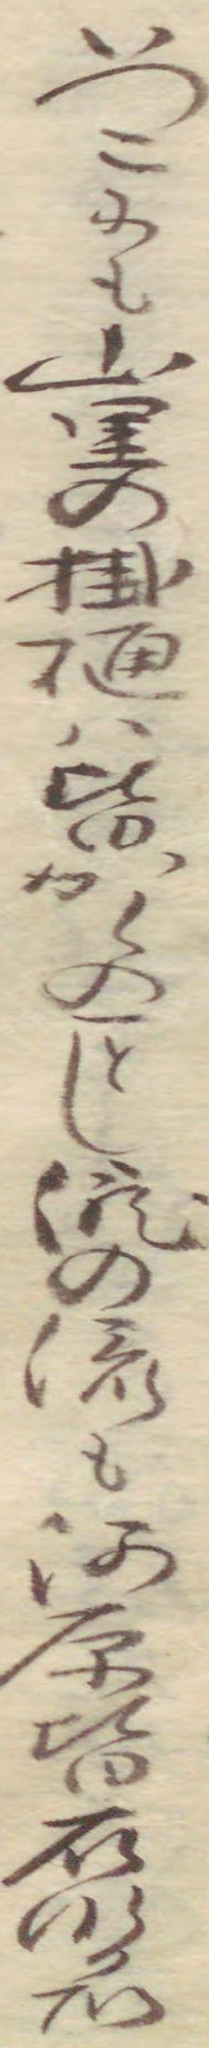いつこにも山里の掛樋は皆かくのことし滝の流も河原皆石なか故
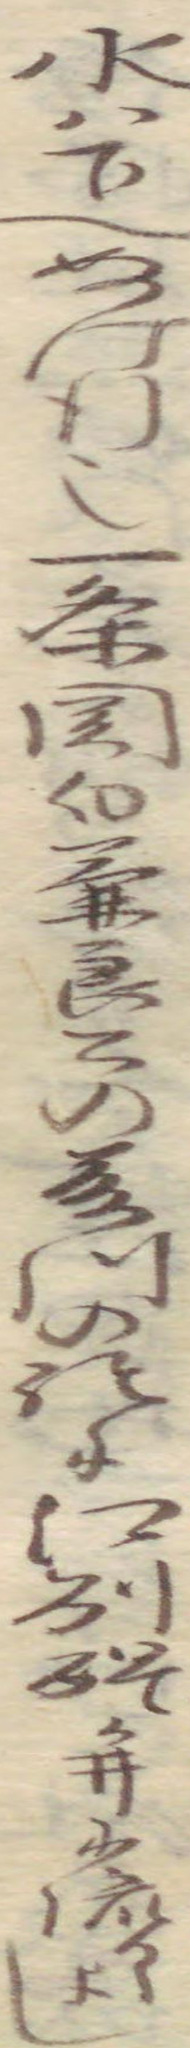水は下へぬけ行也一条関白兼良公の藤川の記に江州醒ヶ井に流るゝよし
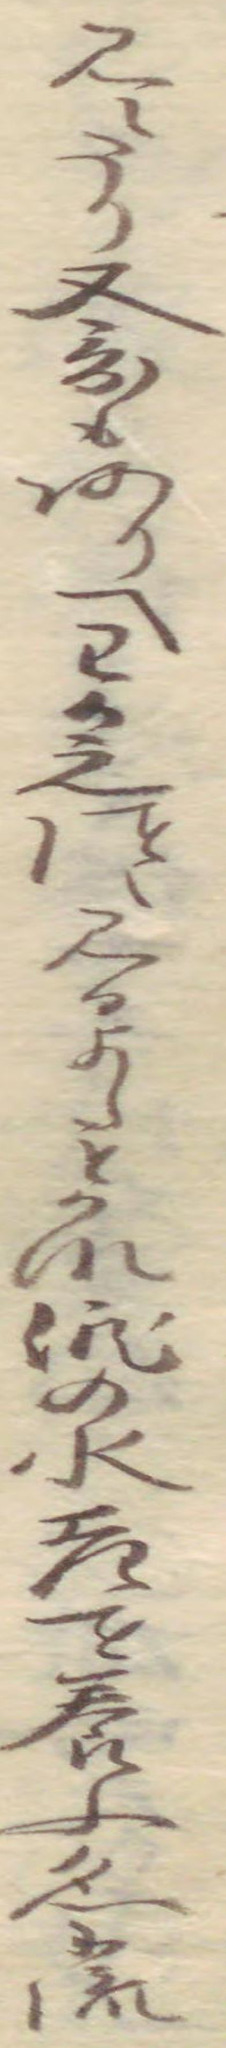見えたり又歌もあり〽わかえつゝ見るよしもかな滝の水老を養ふ名に流
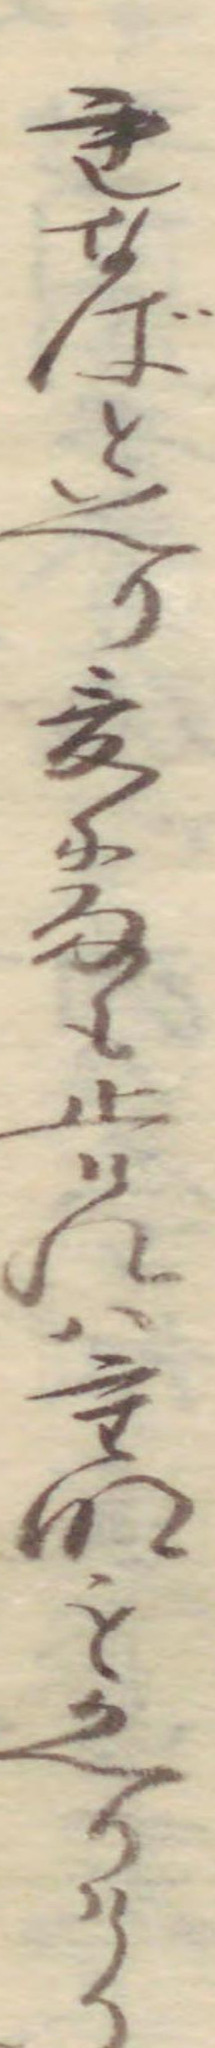れなばといへり爰に雨も止けれは重明もかへりけり
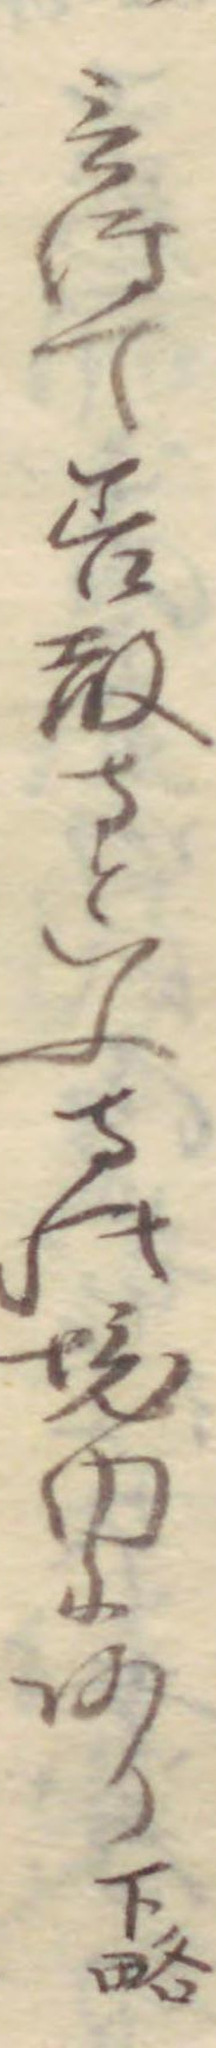言伝て善教寺といふ寺の境内にあり下略
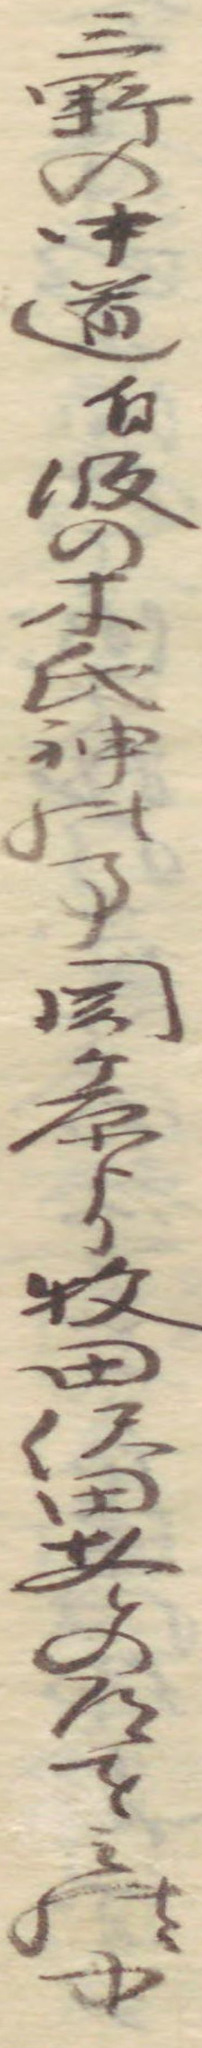三野の中道付飯の木氏神の事関ヶ原より牧田沢田なとの道をみの中
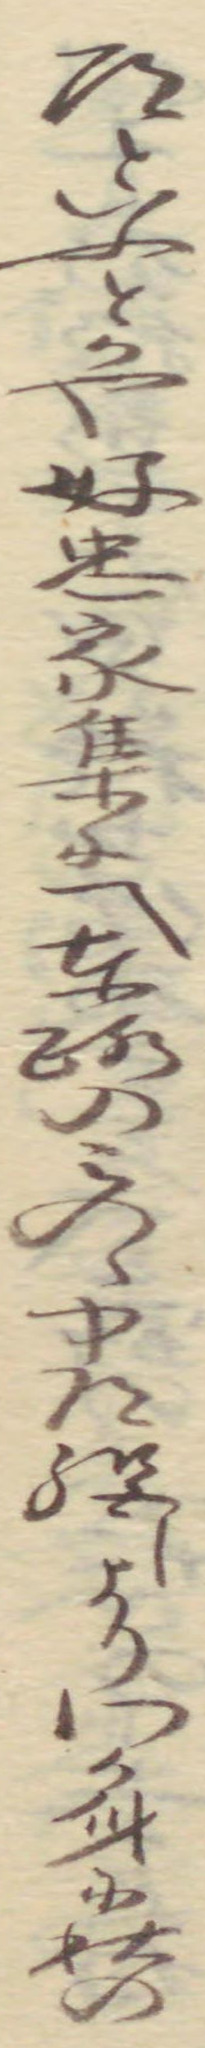道といふとかや好忠家集に〽東路のみのゝ中道絶しよりわか身に秋の
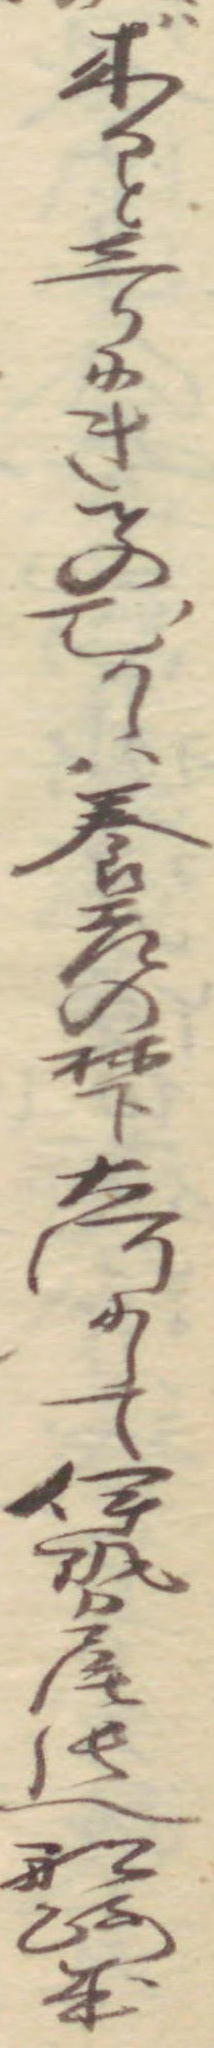来るとしりにきそのむかしは養老の梺大河にして伊勢尾張へ船路成
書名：鶯宿雑記. 巻263-264
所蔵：国立国会図書館 National Diet Library, JAPAN
